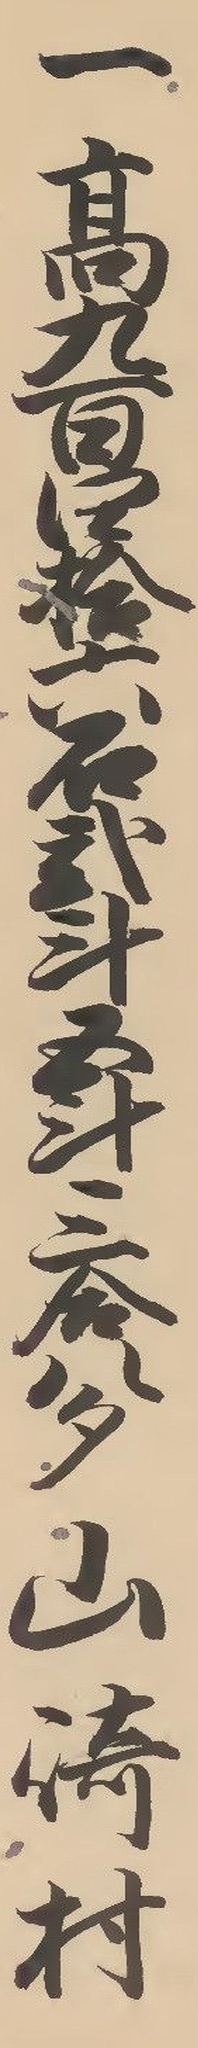一髙九百四拾六石弐斗五斗三合八夕山崎村

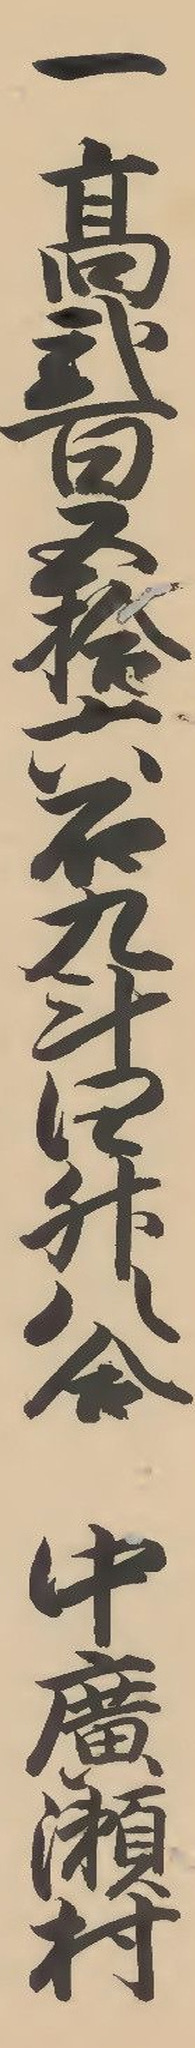一髙弐百五拾六石九斗四升八合中廣瀬村
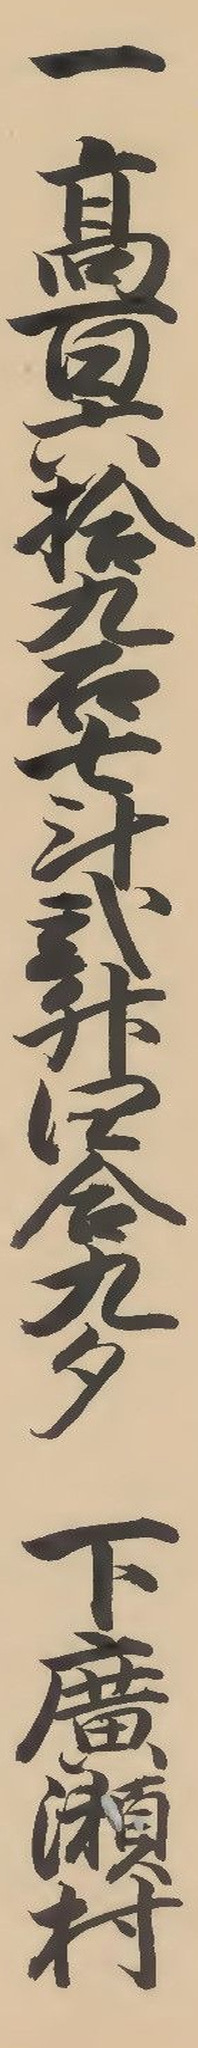一髙百六拾九石七斗弐升四合九夕下廣瀬村
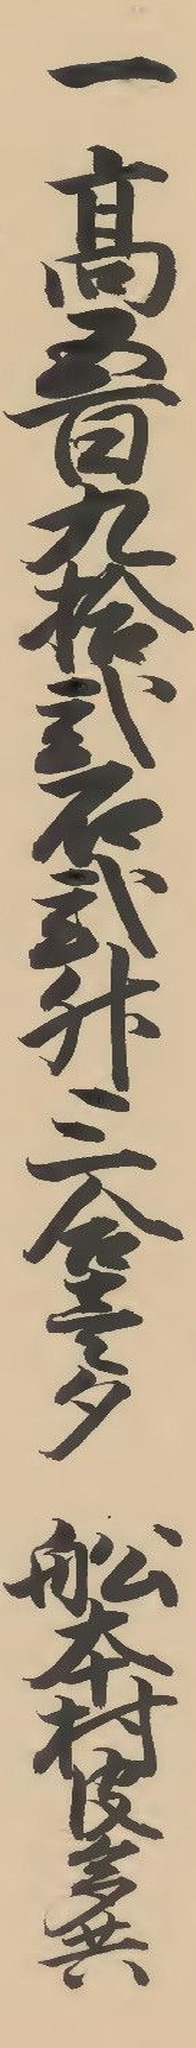一髙五百九拾弐石弐升三合壱夕舩本村皮多共
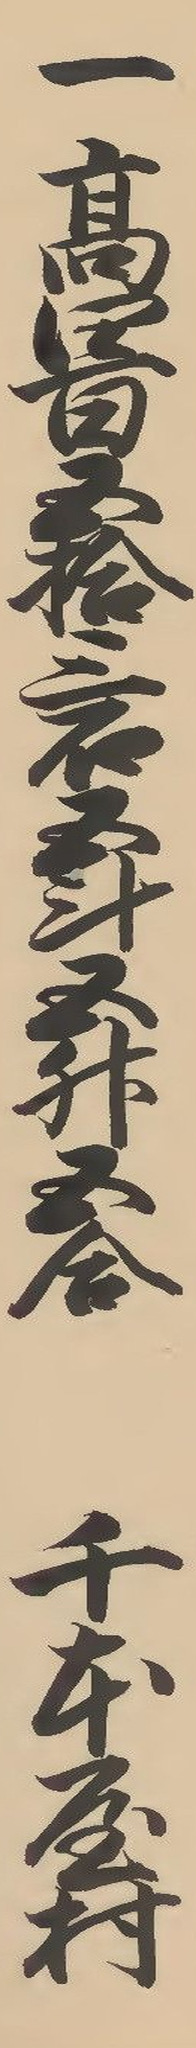一髙四百五拾三石五斗五升五合千本屋村
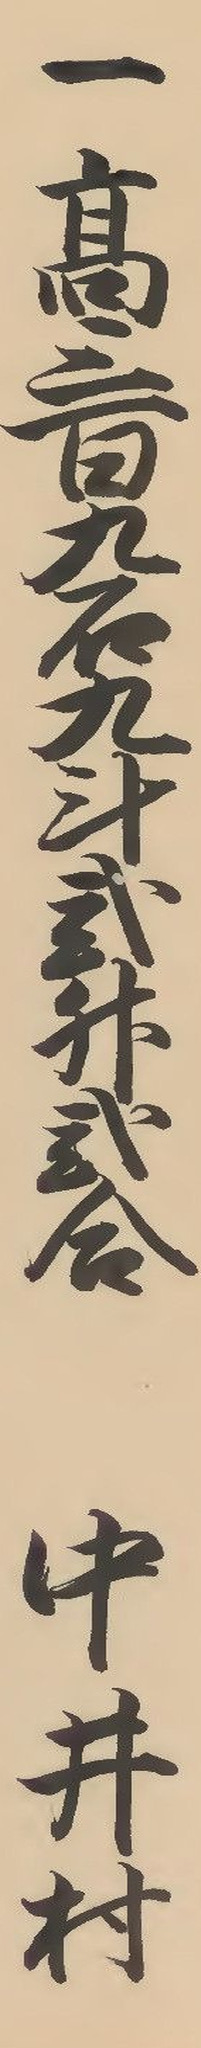一髙三百九石九斗弐升弐合中井村
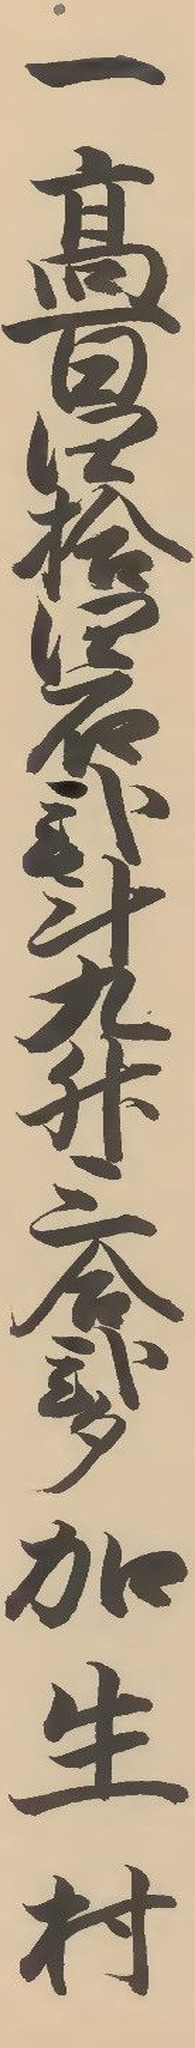一髙百四拾四石弐斗九升三合弐夕加生村
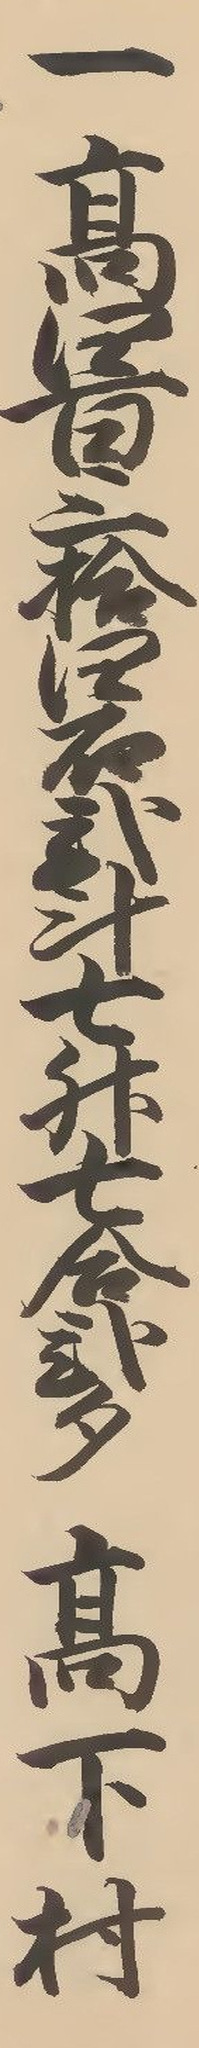一髙四百三拾四石弐斗七升七合弐夕髙下村

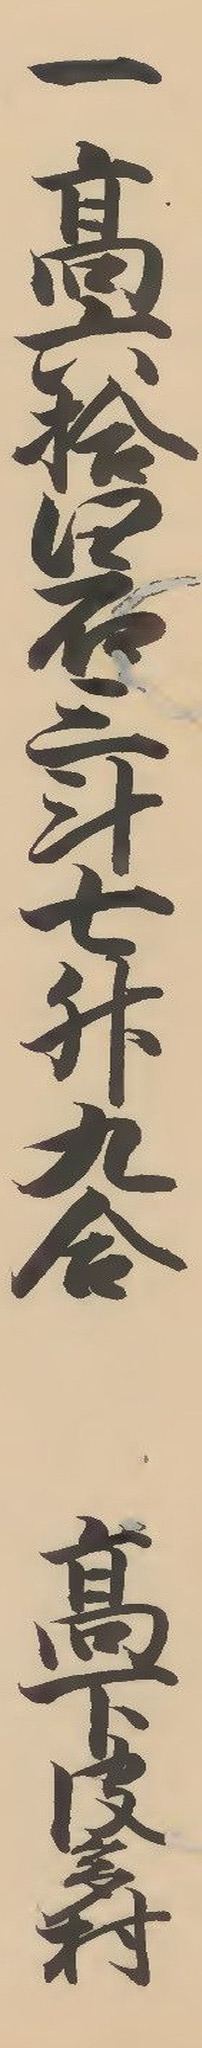一髙六拾四石三斗七升九合髙下皮多村
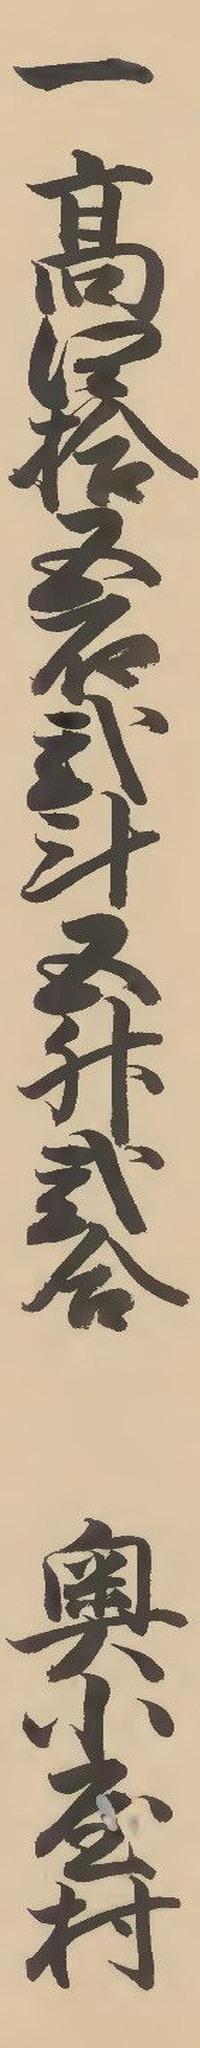一髙四拾五石弐斗五升弐合奥小屋村
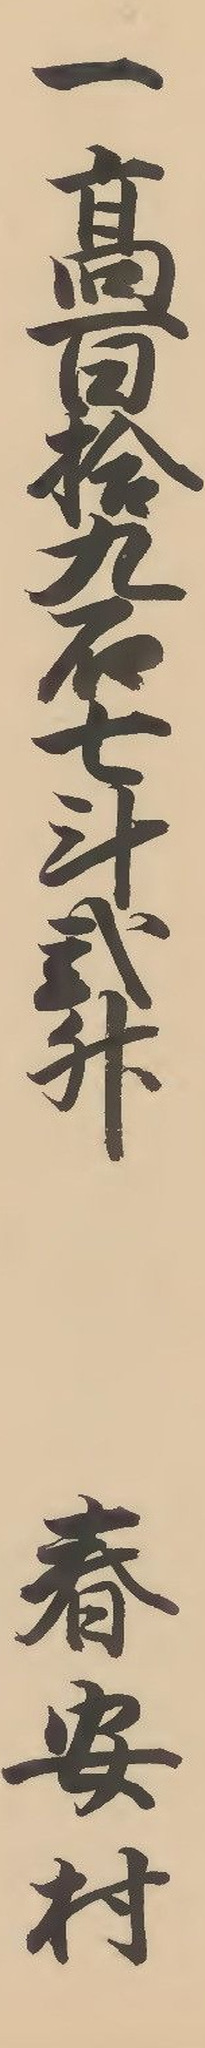一髙百拾九石七斗弐升春安村
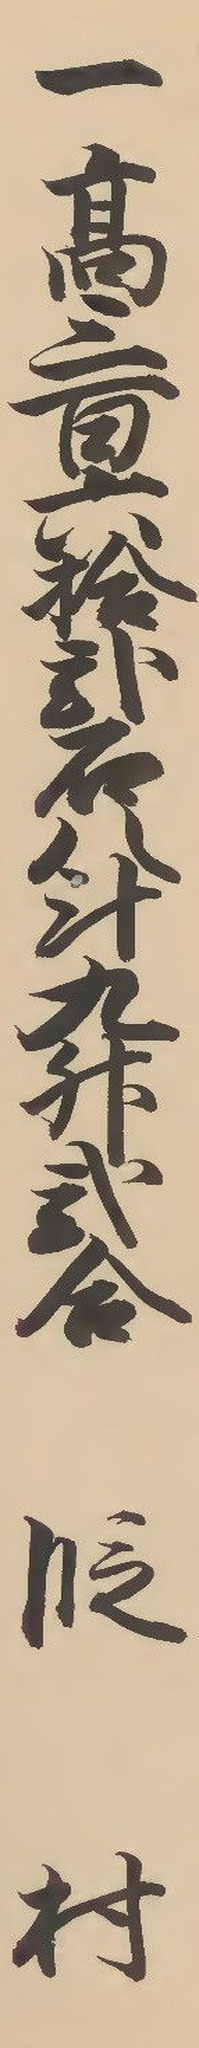一髙三百六拾弐石八斗九升弐合段村
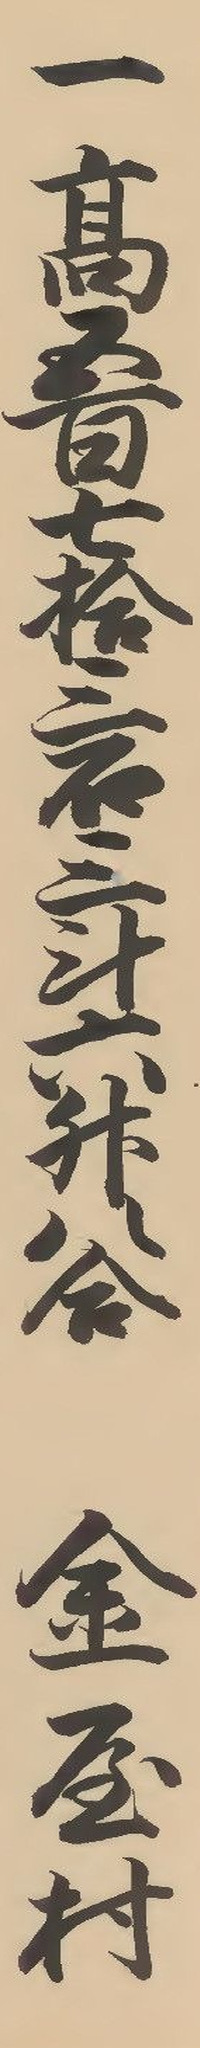一髙五百七拾三石三斗六升八合金屋村
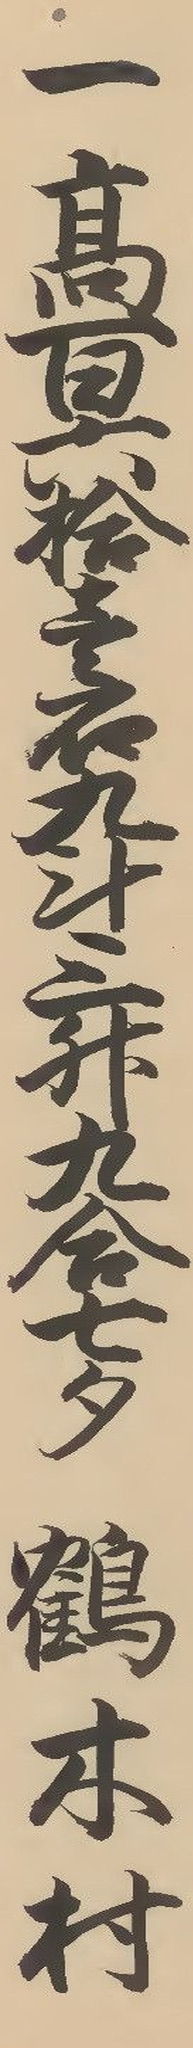一髙百六拾壱石九斗三升九合七夕鶴木村
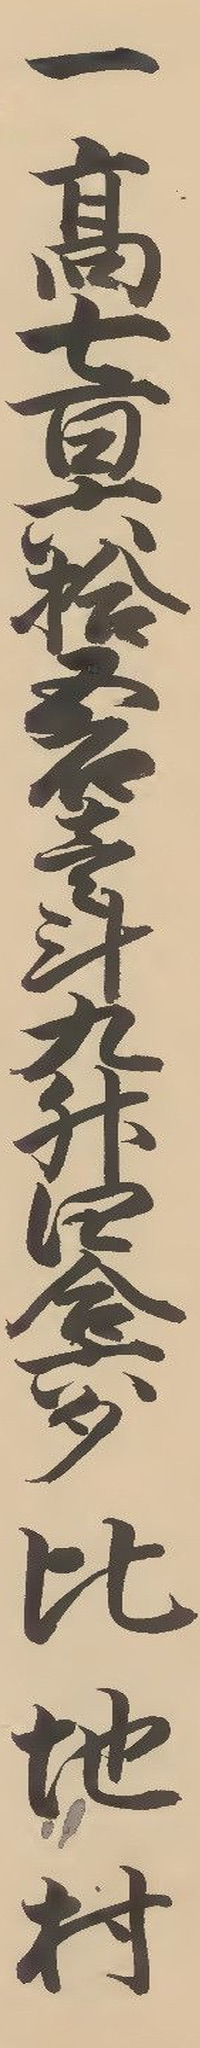一髙七百六拾五石壱斗九升四合六夕比地村
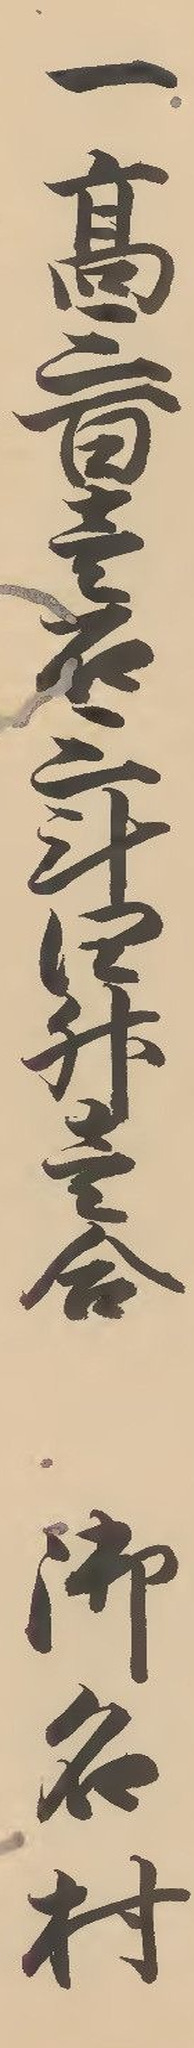一髙三百壱石三斗四升壱合御名村
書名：播磨国郷帳
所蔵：国立公文書館 National Archives of Japan
